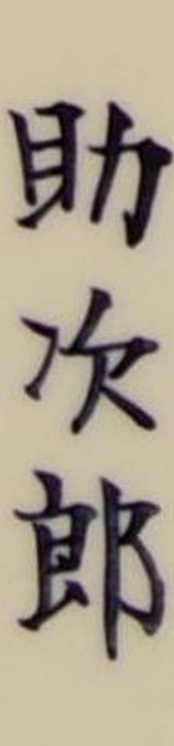助次郎
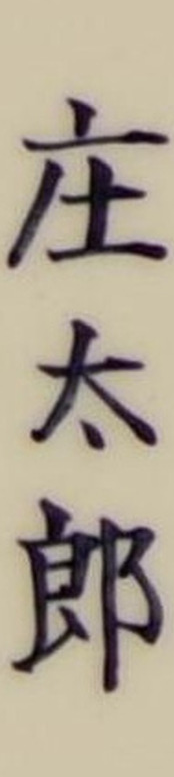庄太郎
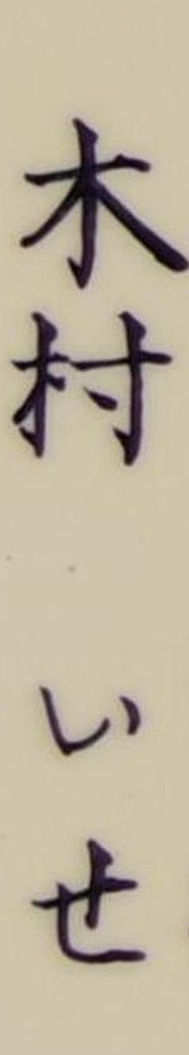木村いせ
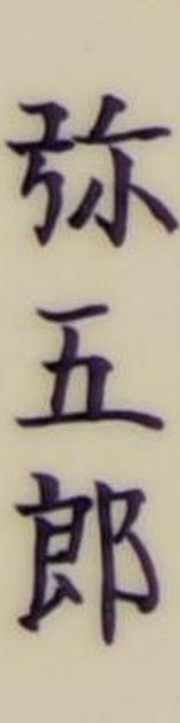弥五郎
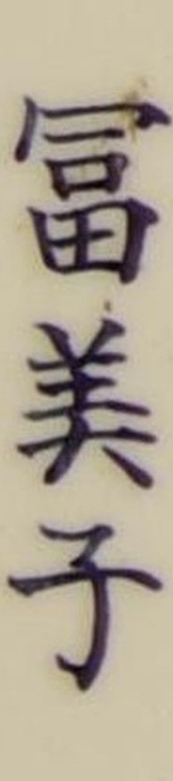冨美子

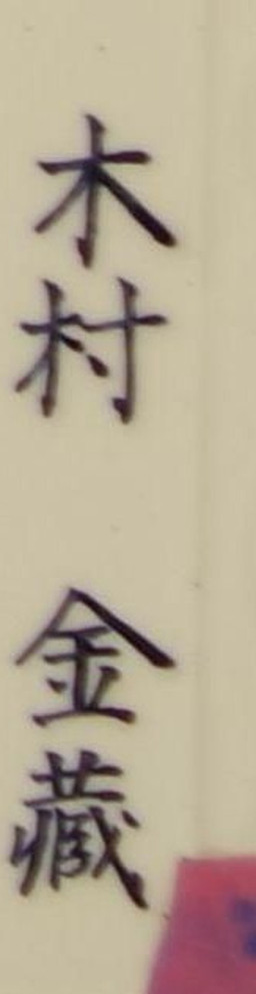木村金蔵
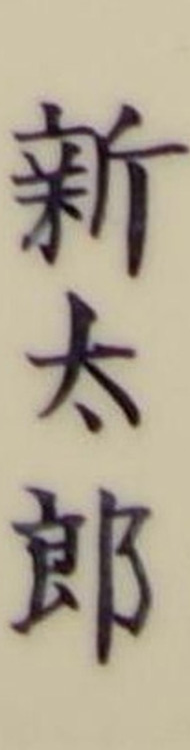新太郎
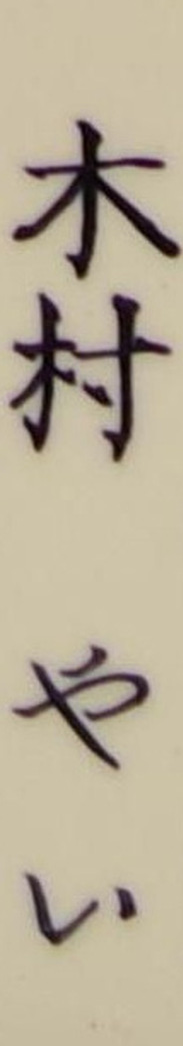木村やい
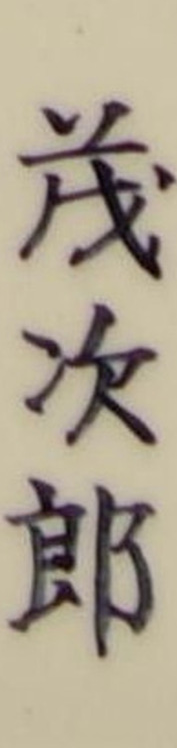茂次郎
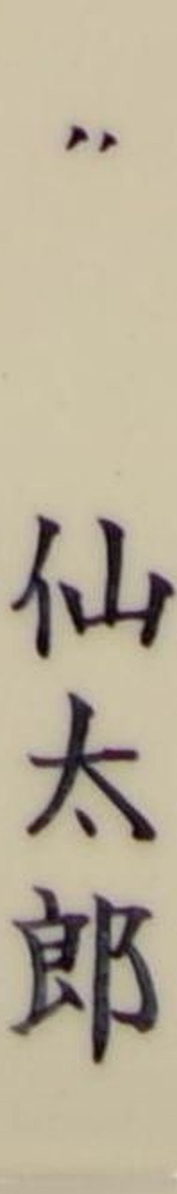仙太郎
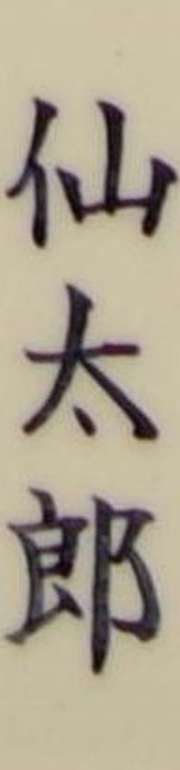仙太郎
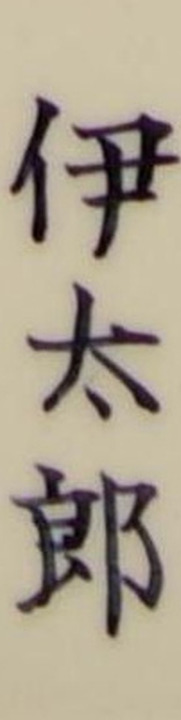伊太郎
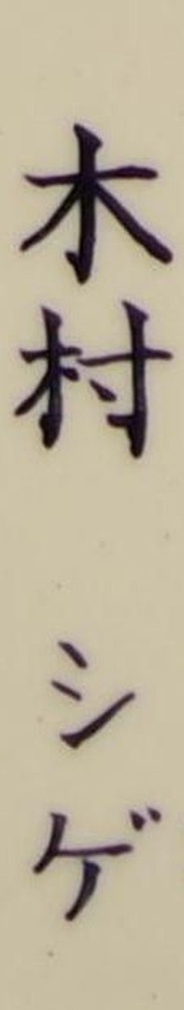木村シゲ
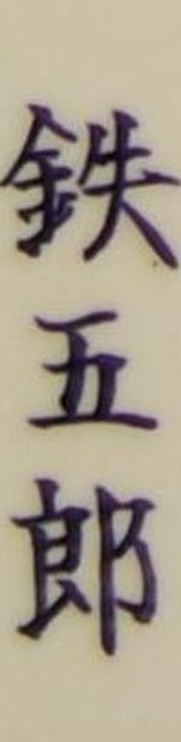鉄五郎
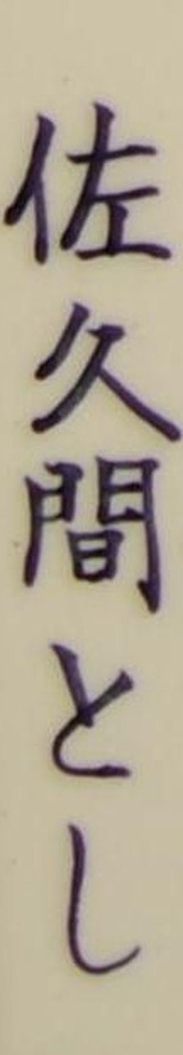佐久間とし

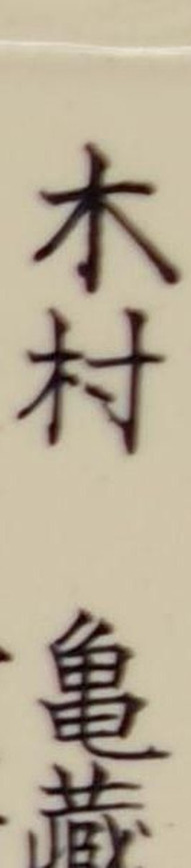木村亀蔵
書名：E~L
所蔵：高野山金剛峯寺
